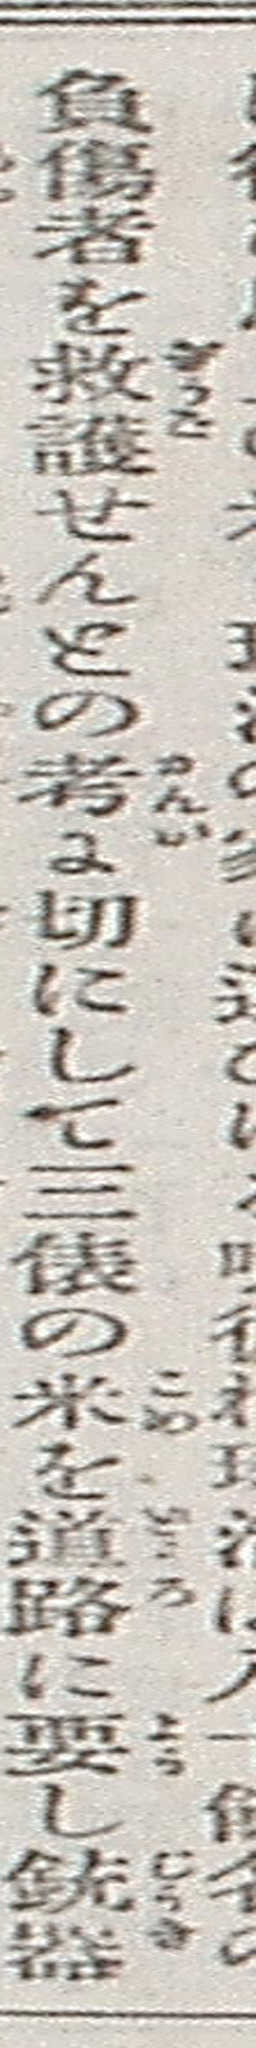負傷者を救護せんとの考に切にして三俵の米を道路に要し銃器
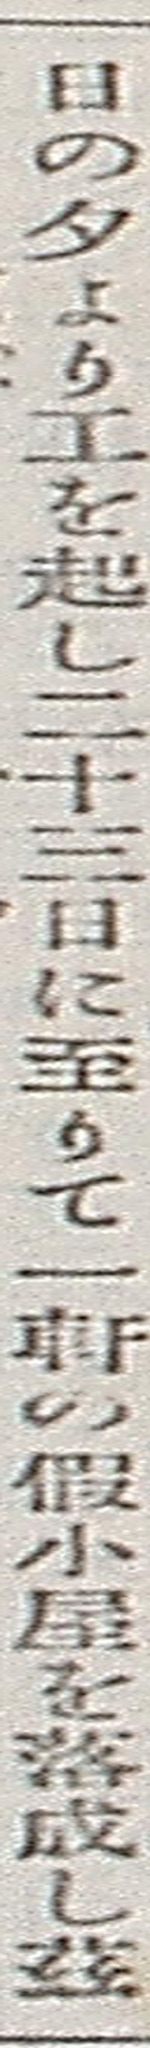日の夕より工を起し二十三日に至りて一軒の仮小屋を落成し茲
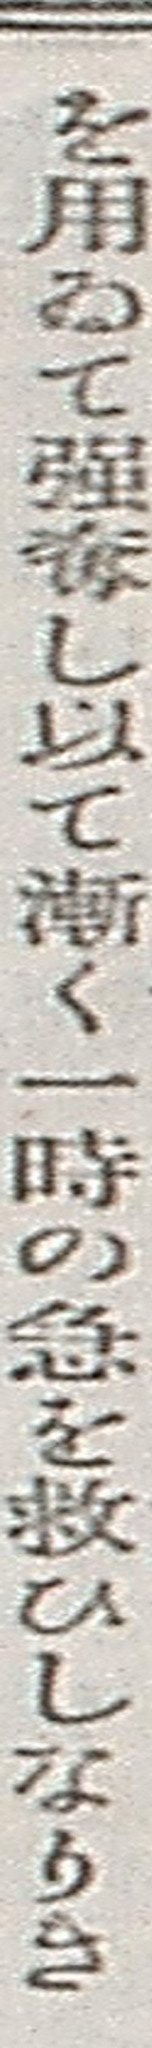を用ゐて強奪し以て漸く一時の急を救ひしなりき
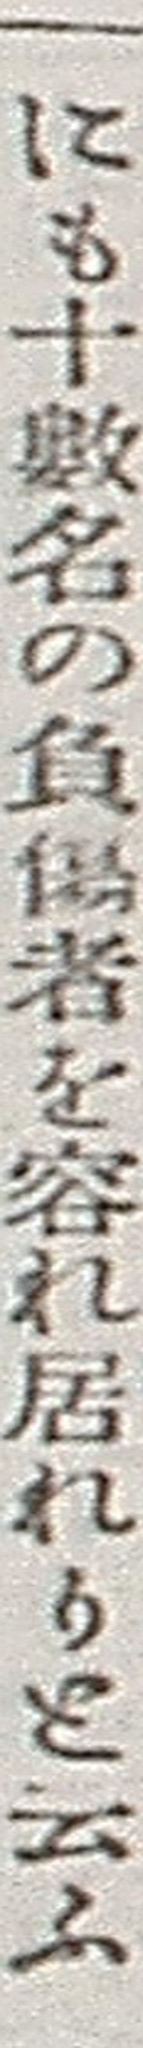にも十数名の負傷者を容れ居れりと云ふ

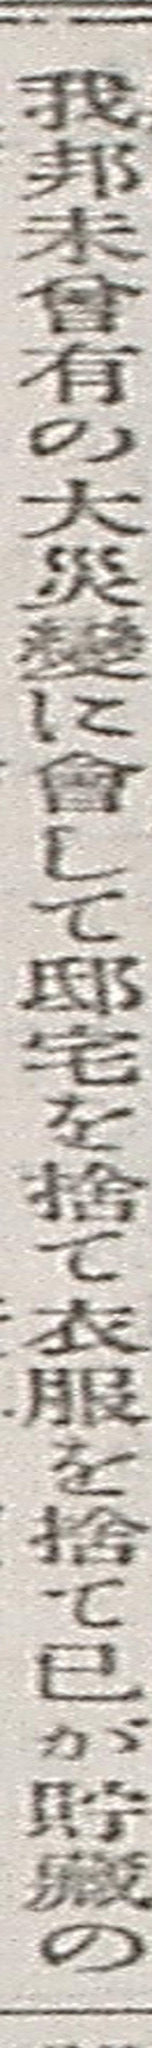我邦未曽有の大災変に会して邸宅を捨て衣服を捨て己が貯蔵の
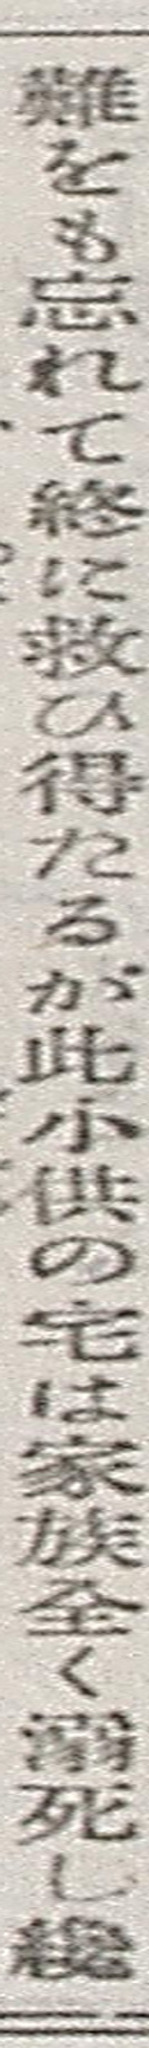難をも忘れて終に救ひ得たるが此小供の宅は家族全く溺死し纔
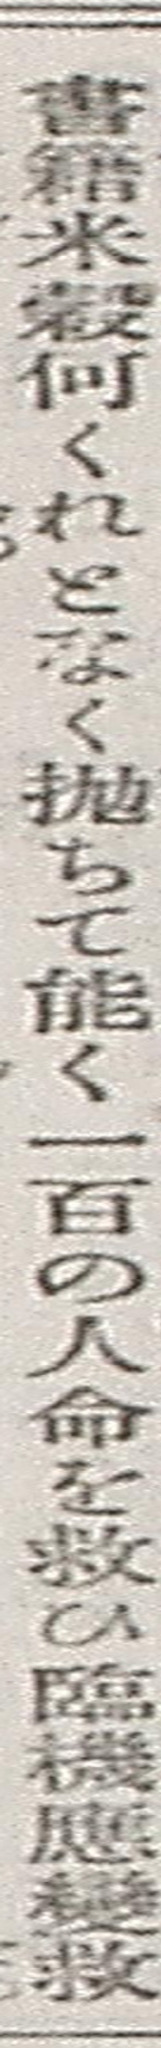書籍米穀何くれとなく抛ちて能く一百の人命を救ひ臨機応変救
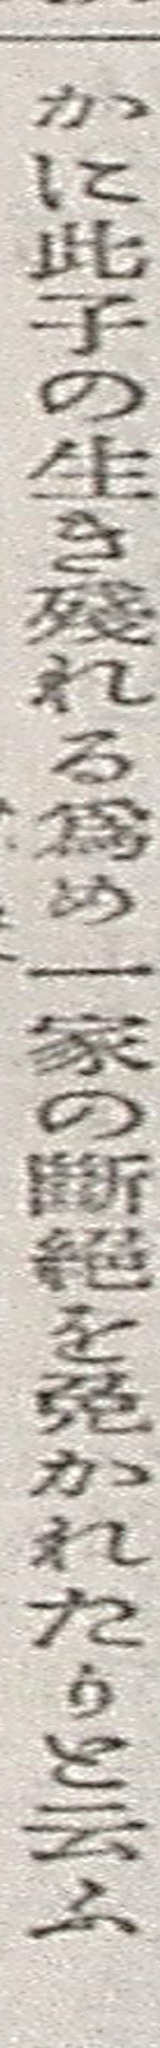かに此子の生き残れる為め一家の断絶を免かれたりと云ふ
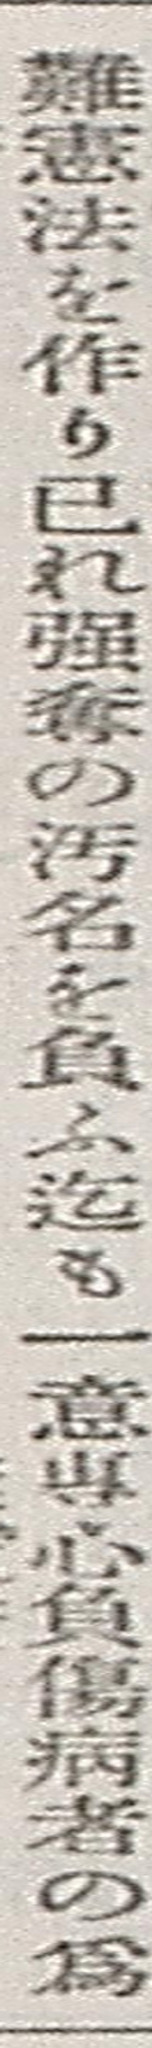難憲法を作り己れ強奪の汚名を負ふ迄も一意専心負傷病者の為
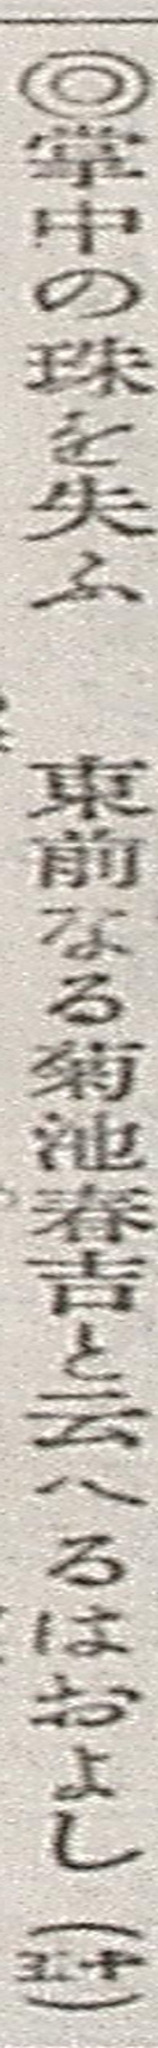◎掌中の玉を失ふ東前なる菊池春吉と云へるはおよし
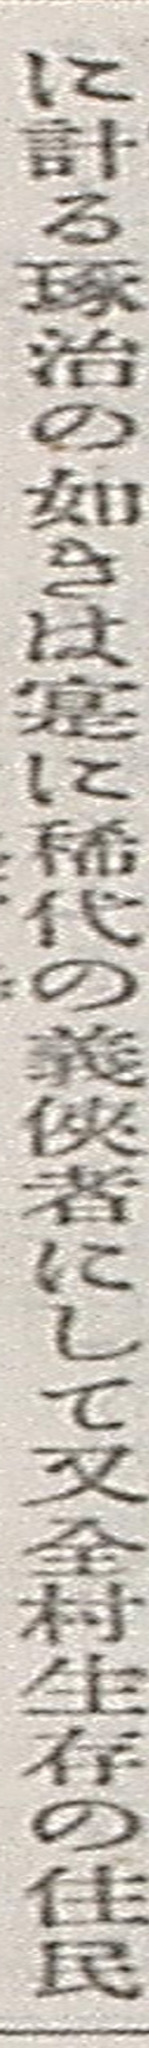に計る琢治の如きは寔に稀代の義侠者にして又全村生存の住民
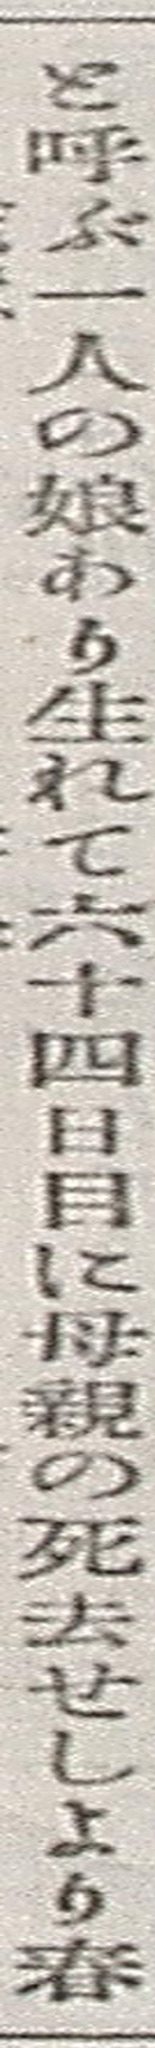と呼ぶ一人の娘あり生れて六十四日目に母親の死去せしより春
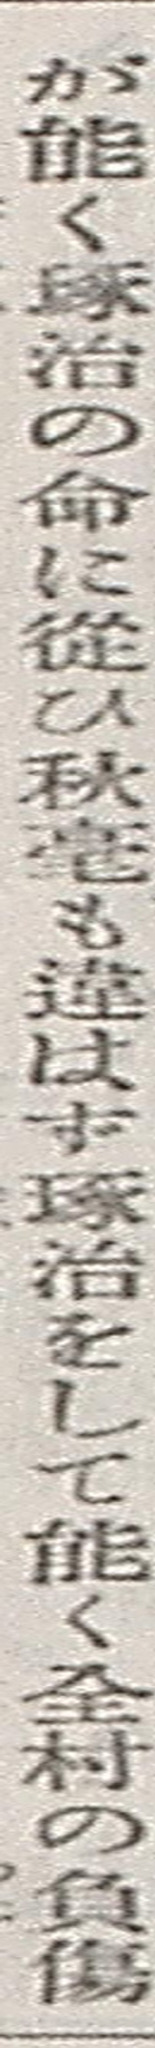が能く琢治の命に従ひ秋毫も違はず琢治をして能く全村の負傷
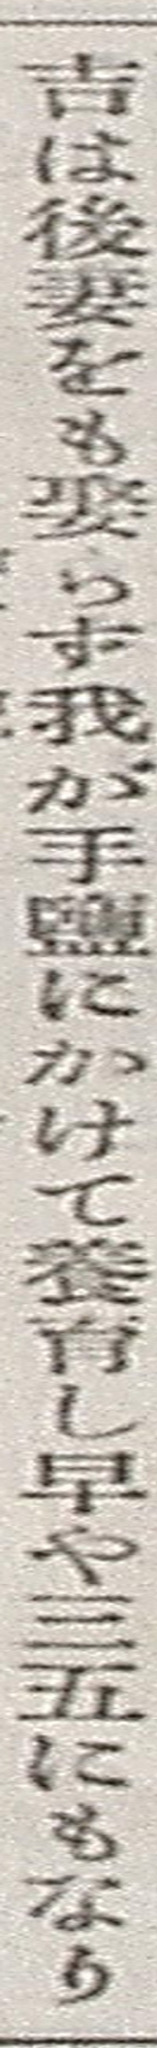吉は後妻をも娶らず我が手塩にかけて養育し早や三十五にもなり
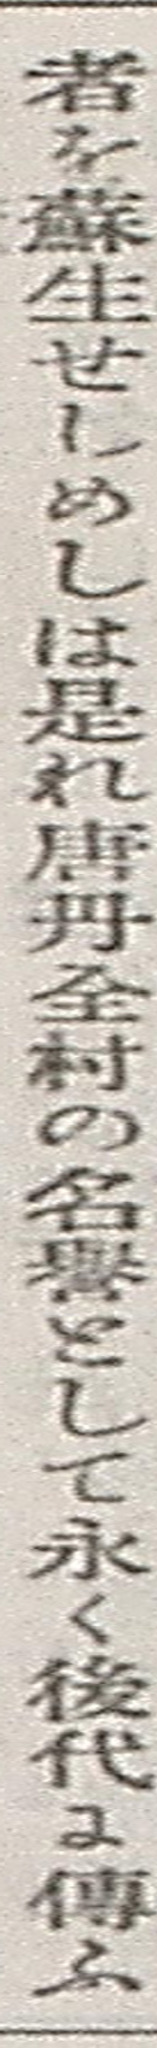者を蘇生せしめしは是れ唐丹全村の名誉として永く後代に伝ふ
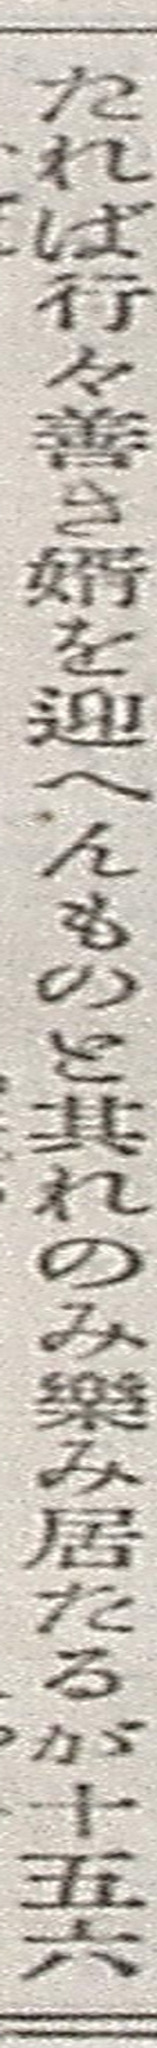たれば行々善き婿を迎へんものと其れのみ楽み居たるが十五六
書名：風俗畫報臨時増刊第百二十號　大海嘯被害録（下）
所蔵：東京大学地震研究所図書室 Earthquake Research Institute Library, The University of Tokyo, JAPAN
